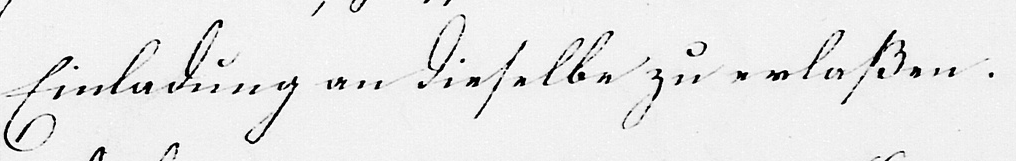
Einladung an dieselbe zu erlaßen.
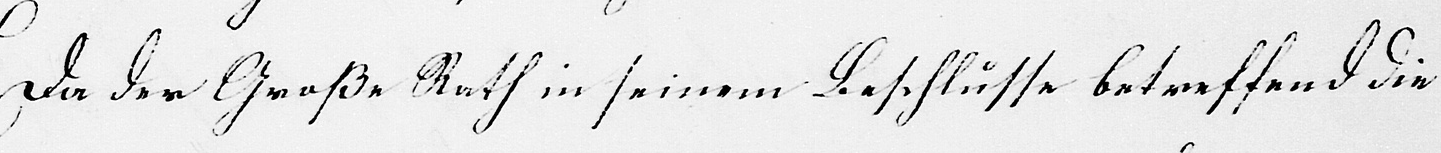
Da der Große Rath in seinem Beschlusse betreffend die
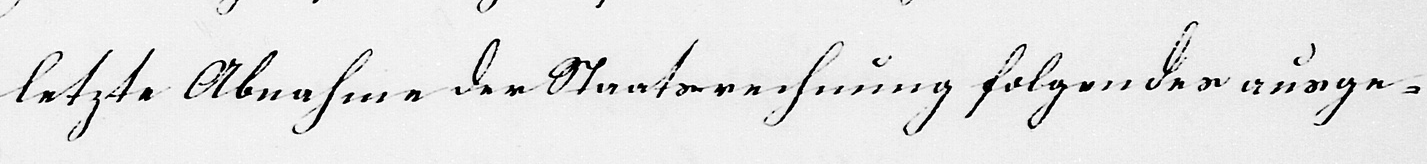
letzte Abnahme der Staatsrechnung folgendes ausge¬
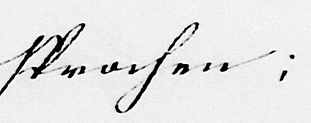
sprochen;
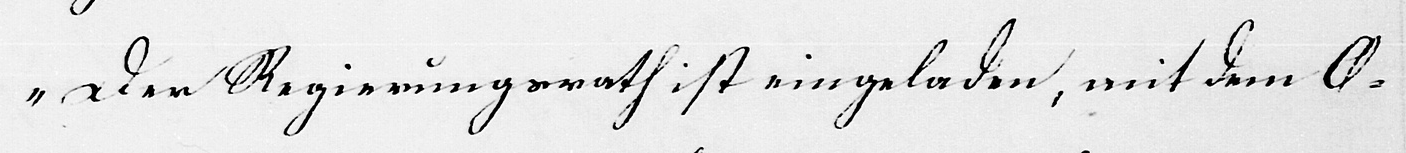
„Der Regierungsrath ist eingeladen, mit dem O¬
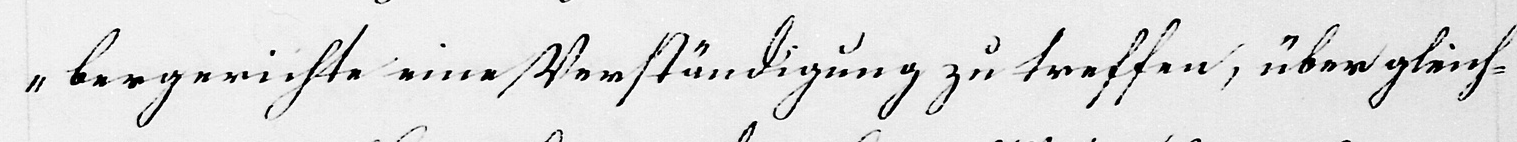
bergerichte eine Verständigung zu treffen, über gleich¬
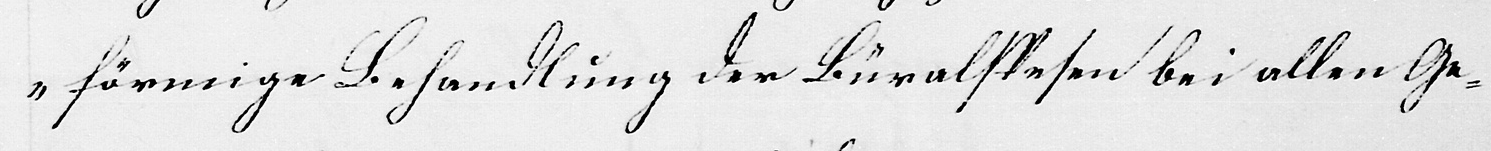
förmige Behandlung der Büralspesen bei allen Ge¬
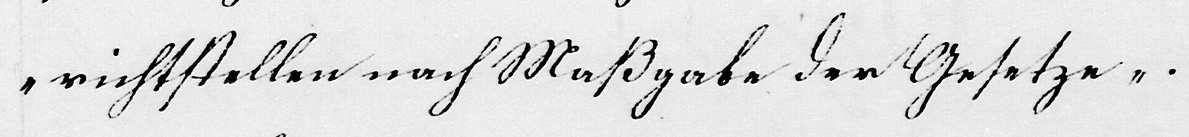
richtstellen nach Maßgabe der Gesetze“.
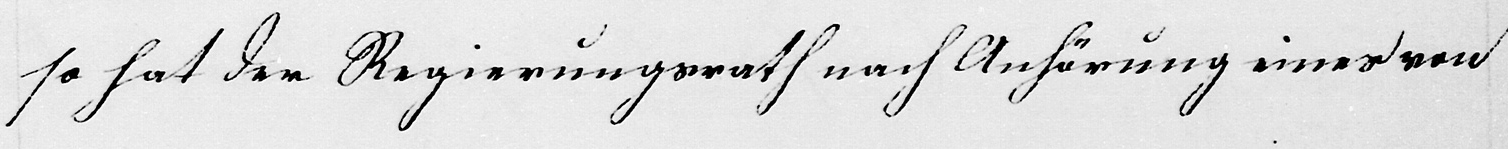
so hat der Regierungsrath nach Anhörung eines von
